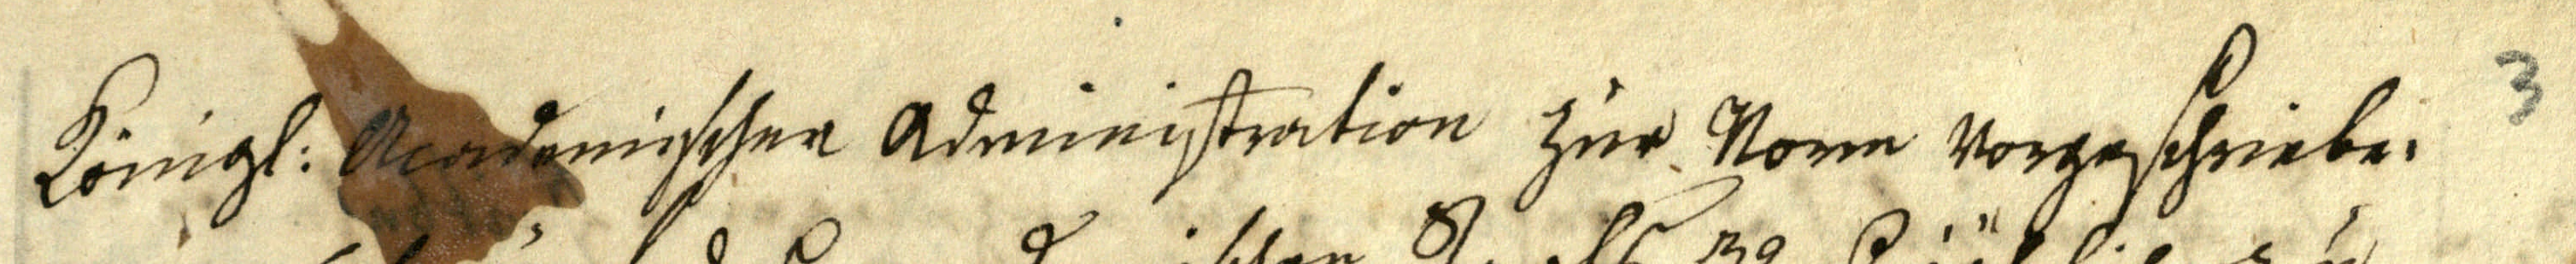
Königl. Academischen Administration zur Norm vorgeschriebe¬
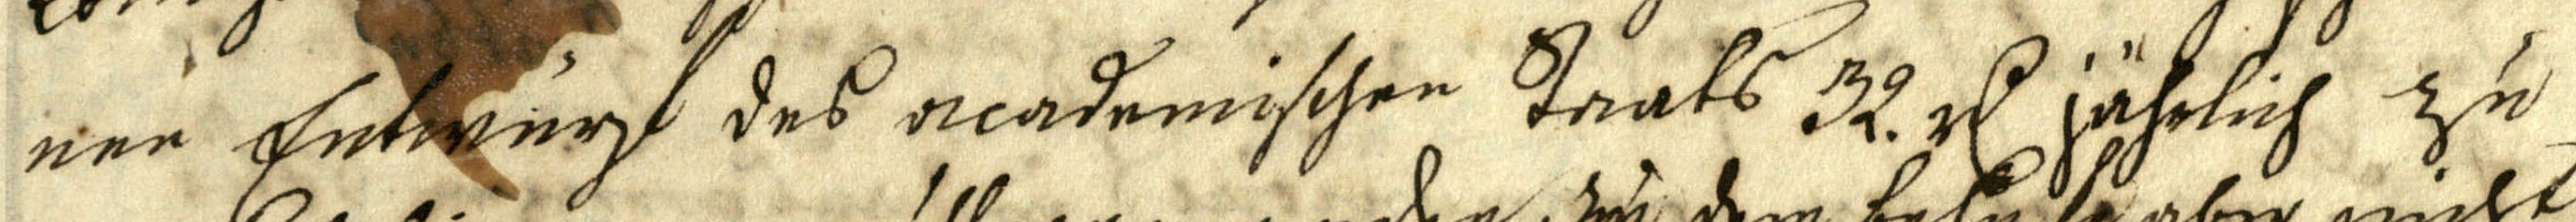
nen Entwurf des academischen Staats 32. r. jährlich zu
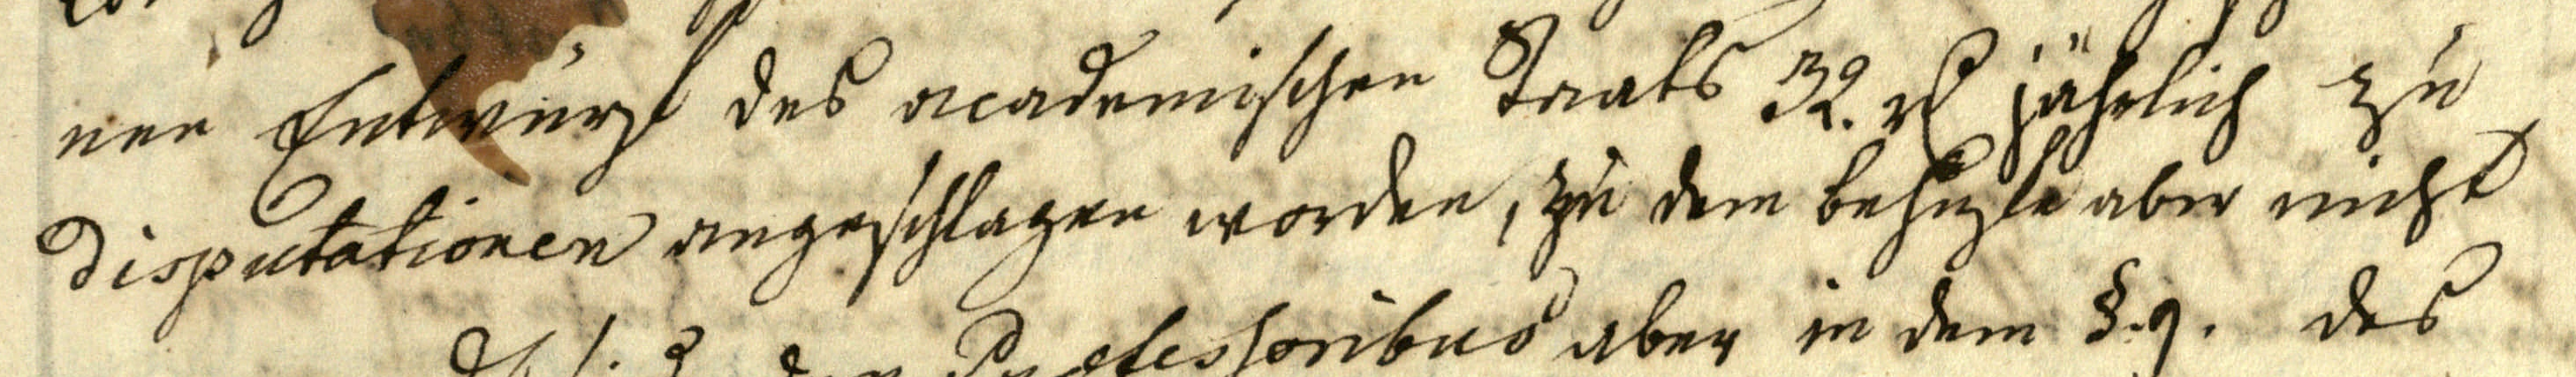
Disputationen angeschlagen worden, zu dem Behufe aber nicht
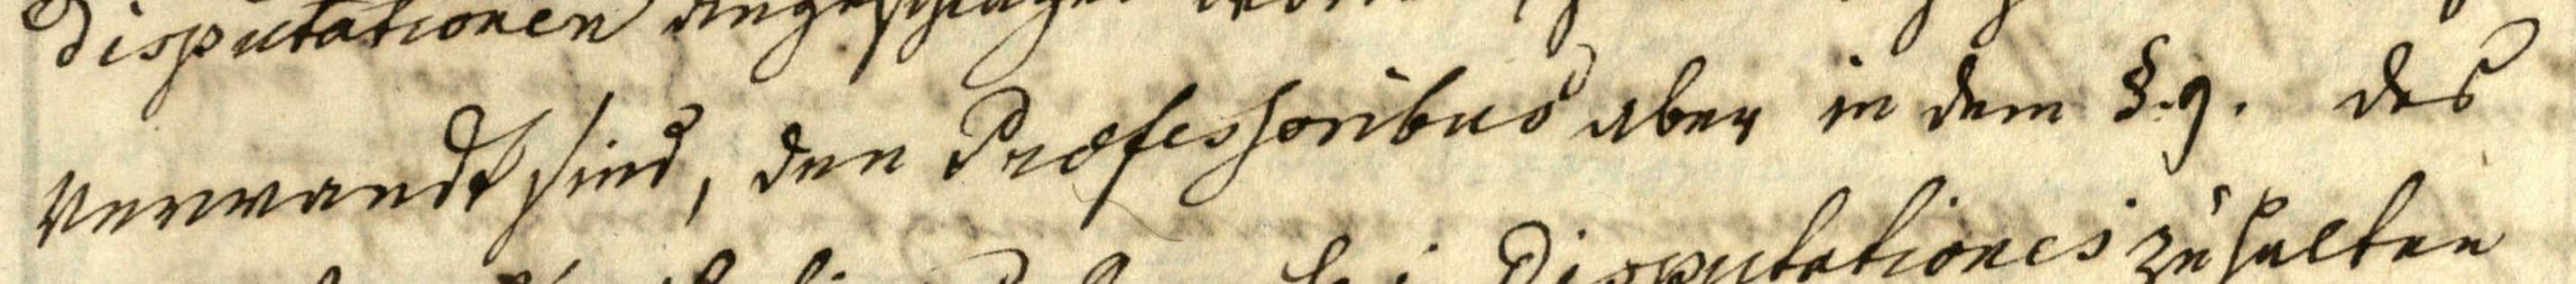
verwandt sind, den Professoribus aber in dem § 9. des
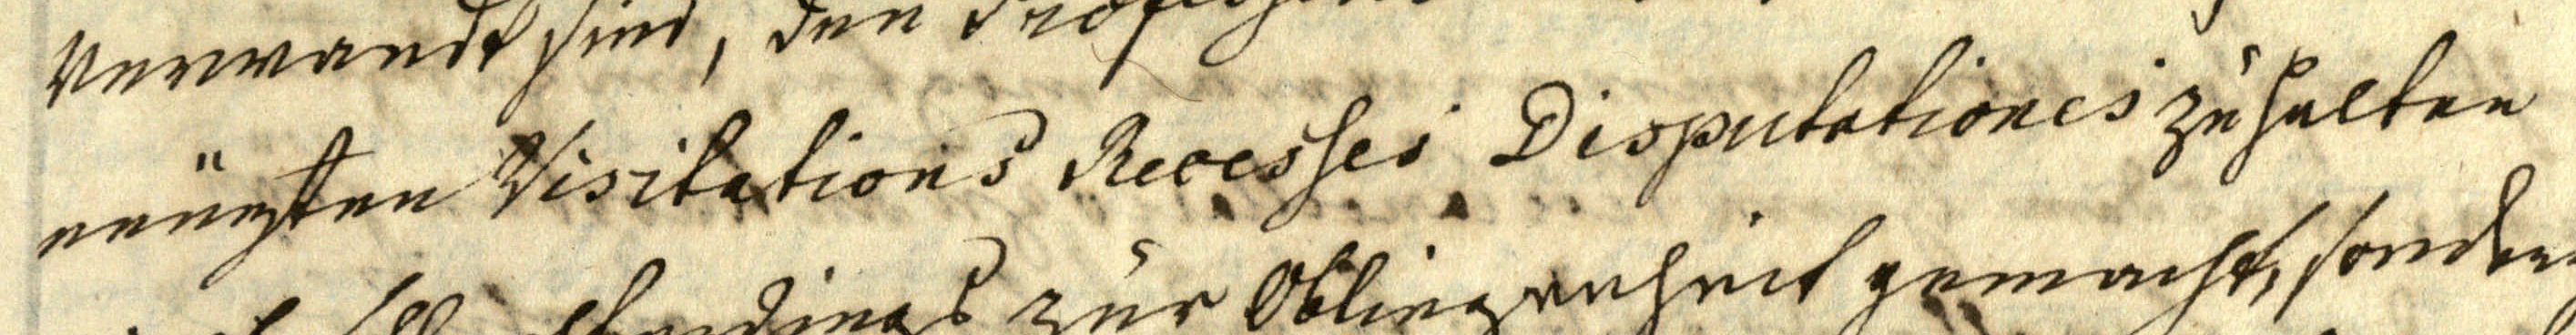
neuesten Visitations Recesses Disputationes zu halten
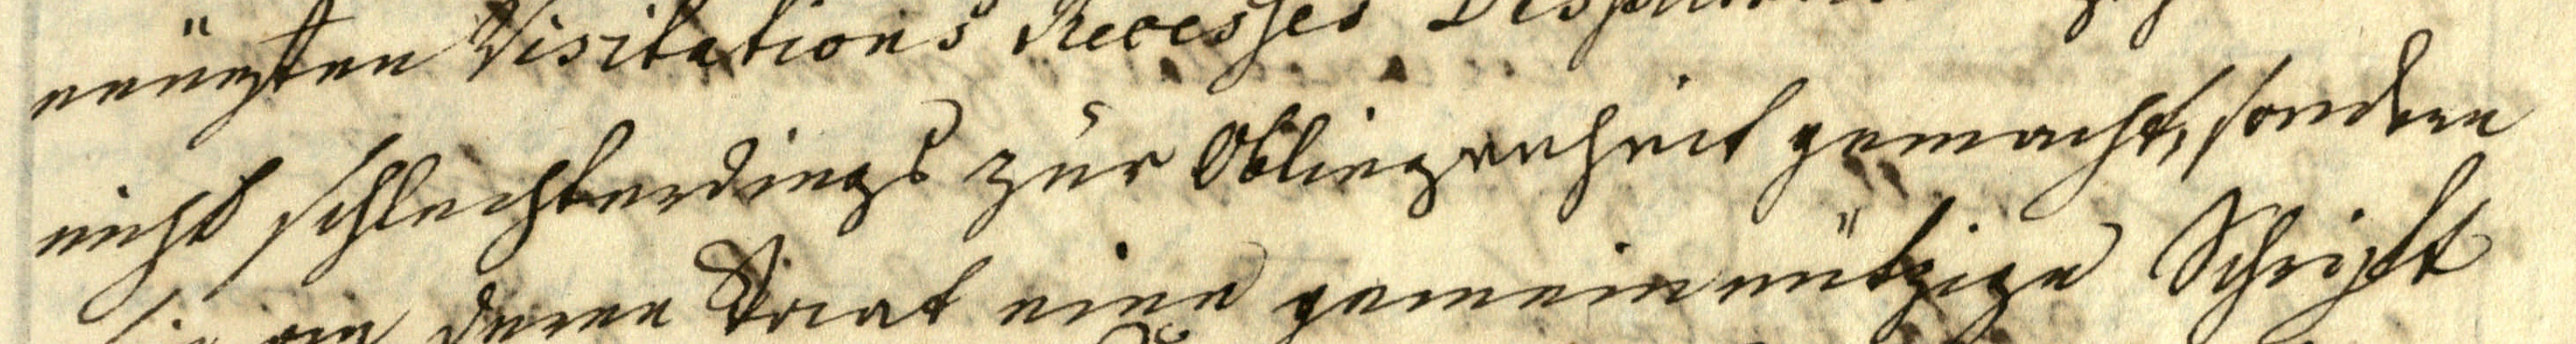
nicht schlechterdings zur Obliegenheit gemacht, sondern
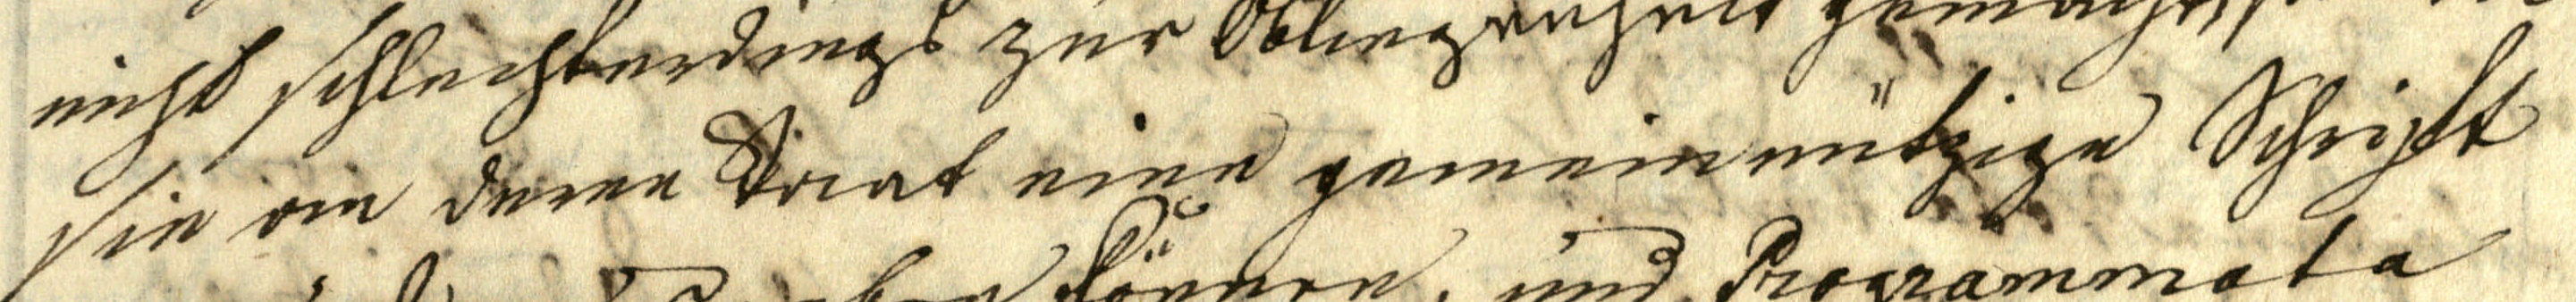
sie in deren Staat eine gemeinützige Schrift
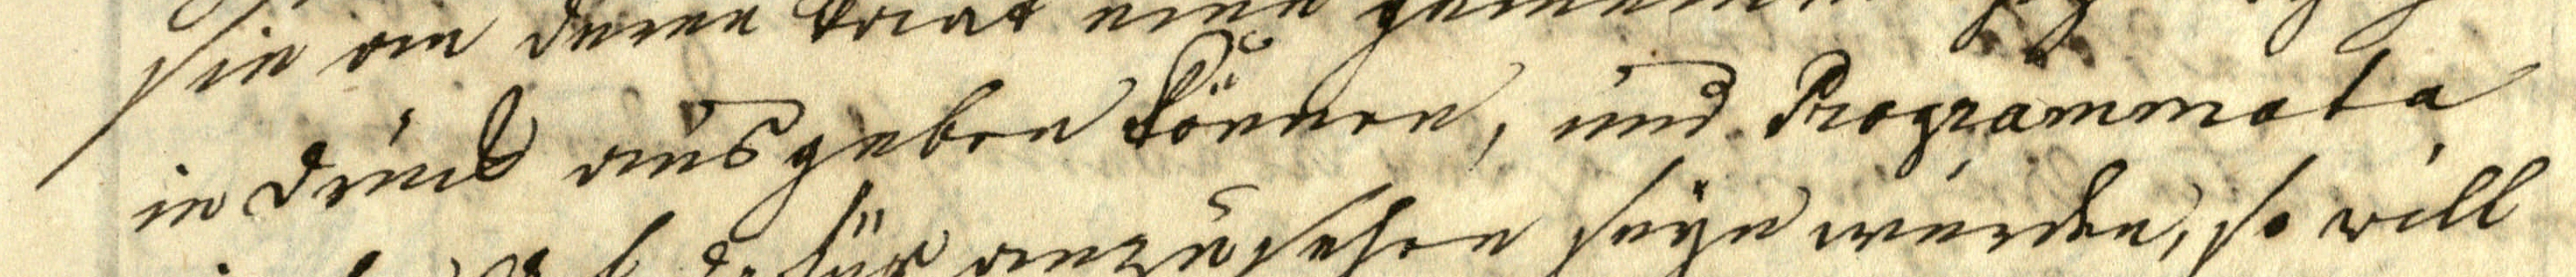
in Druck ausgeben können, und Programmata
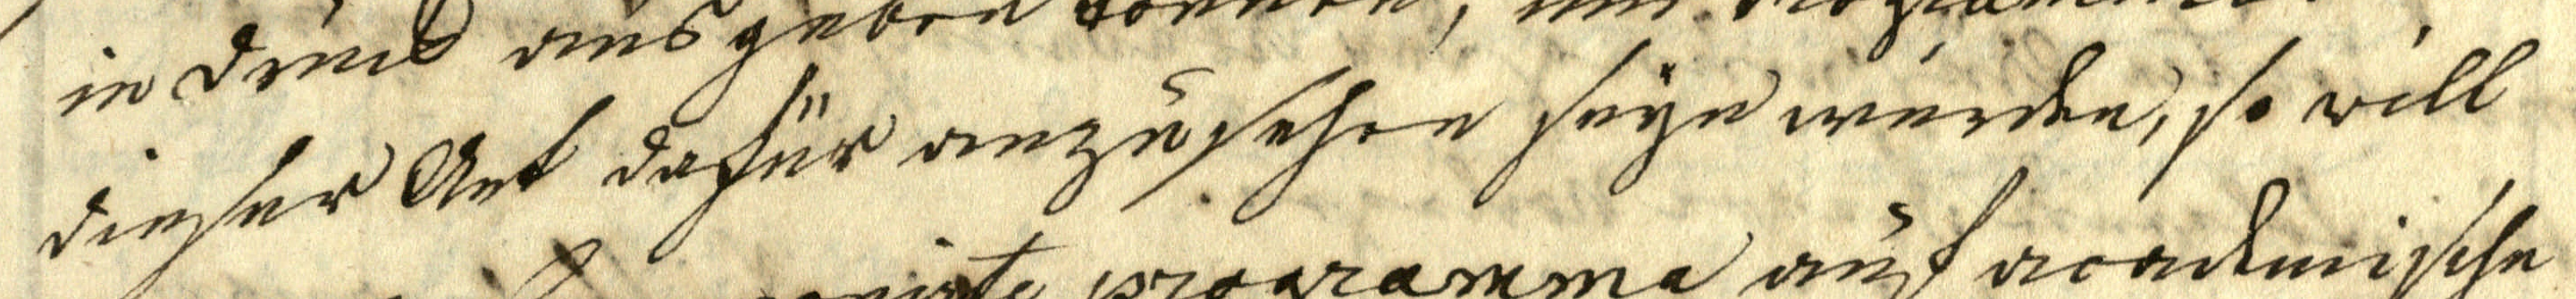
dieser Art dafür anzusehen seÿn werden, so will
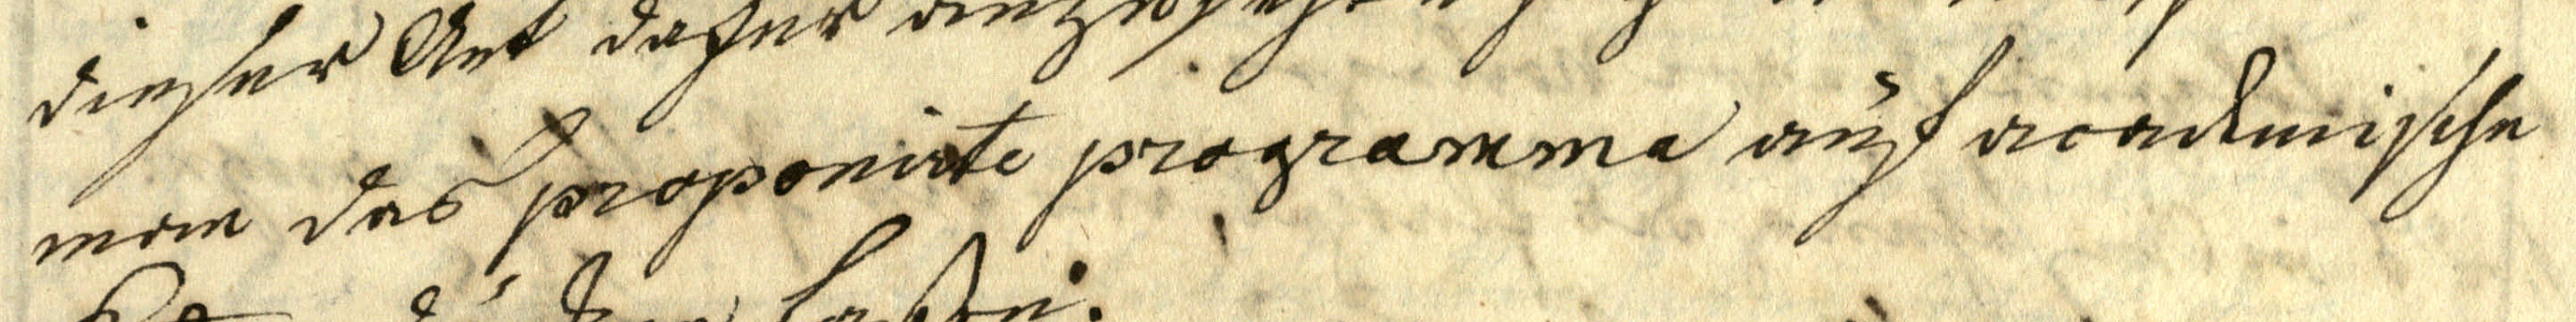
man das proponirte programma auf academische
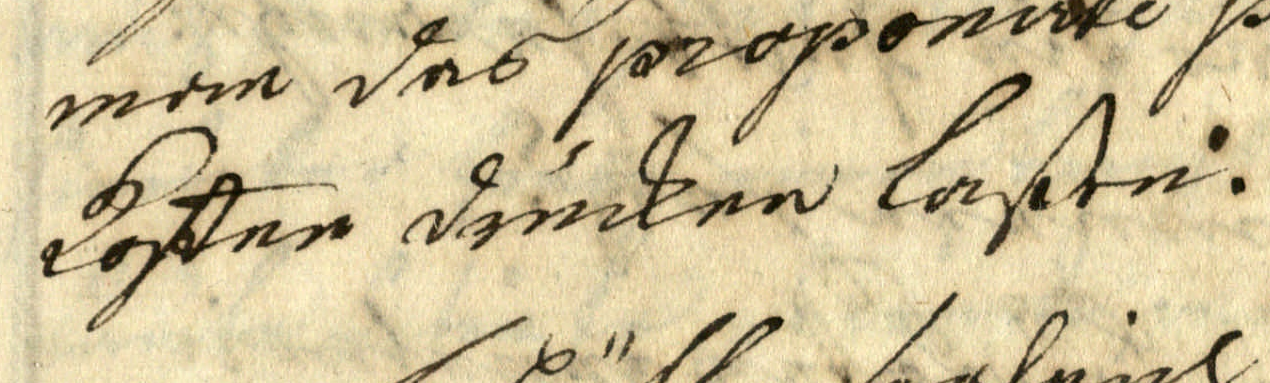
Kosten drucken laßen.
